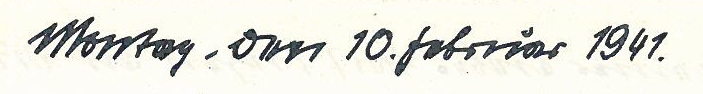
Montag, den 10.Februar 1941.
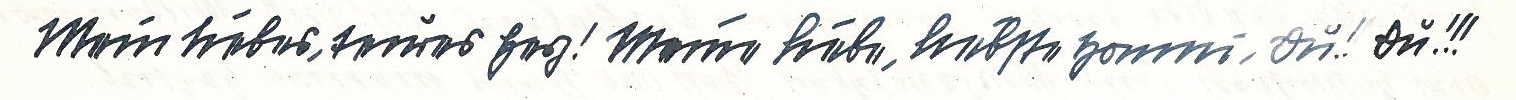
Mein liebes, teures Herz! Meine liebe, liebste , Du! Du!!!
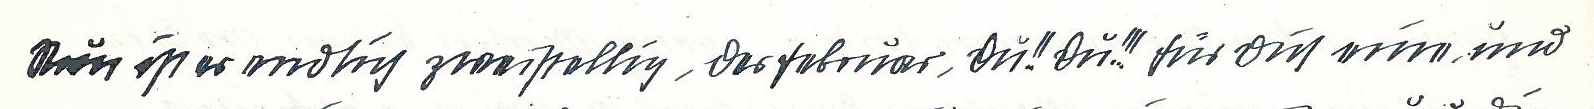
Nun ist er endlich zweistellig, der Februar, Du! Du!!! Für Dich eine, und
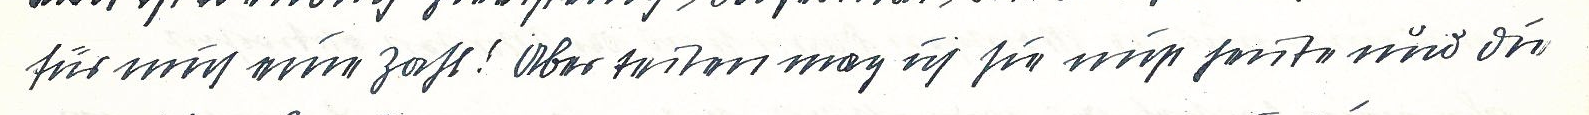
für mich eine Zahl! Aber teilen mag ich sie nicht heute und die
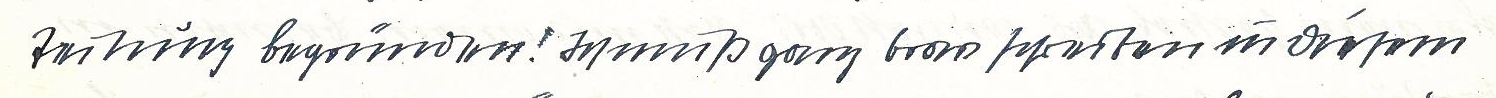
Teilung begründen! Ich muß ganz brav schreiben in diesem
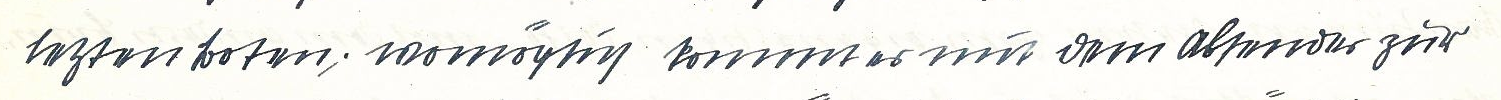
letzten Boten; womöglich kommt er mit dem Absender zur
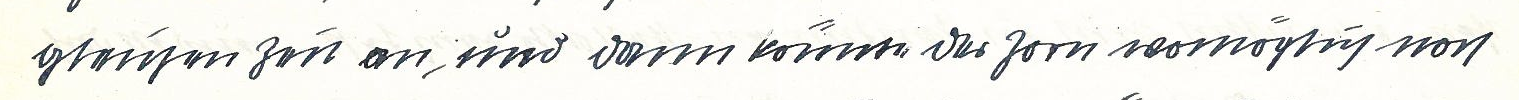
gleichen Zeit an, und dann könnte der Zorn womöglich noch
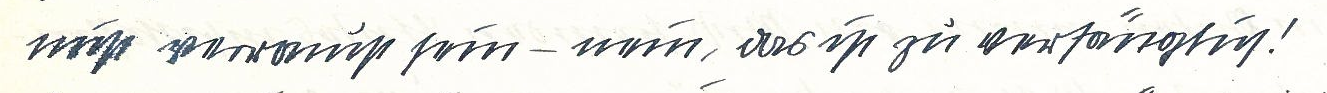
nicht verraucht sein – nein, das ist zu verfänglich!
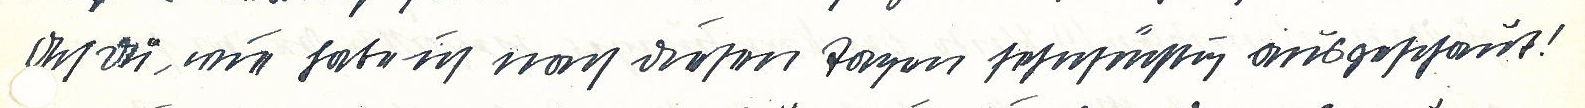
Ach Du, wie habe ich nach diesen Tagen sehnsüchtig ausgeschaut!
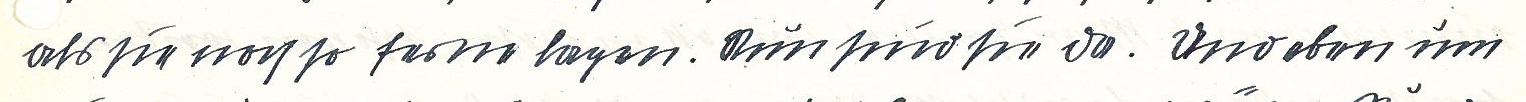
Als sie noch so fern lagen, nun sind sie da. Und eben um
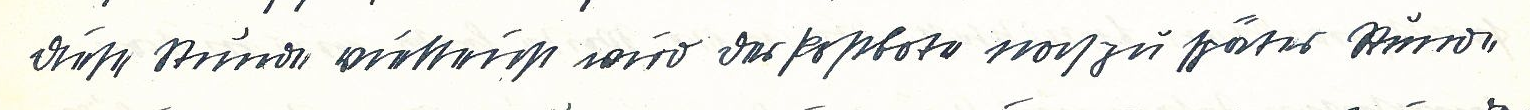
diese Stunde vielleicht wird der Postbote noch zu später Stunde
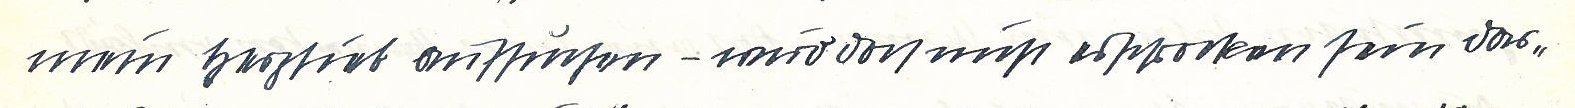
mein Herzlieb aufsuchen – wird doch nicht erschrocken sein dar¬
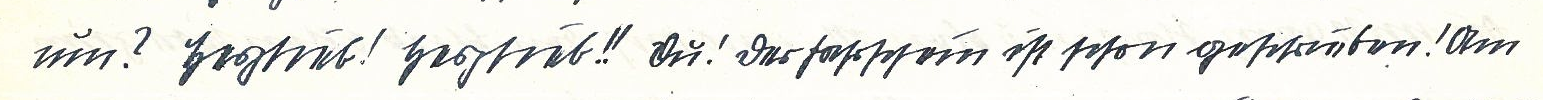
um? Herzlieb! Herzlieb!! Du! Der Fahrschein ist schon geschrieben! Am
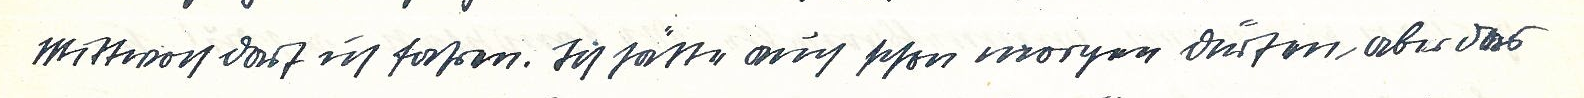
Mittwoch darf ich fahren. Ich hätte auch schon morgen dürfen, aber das
